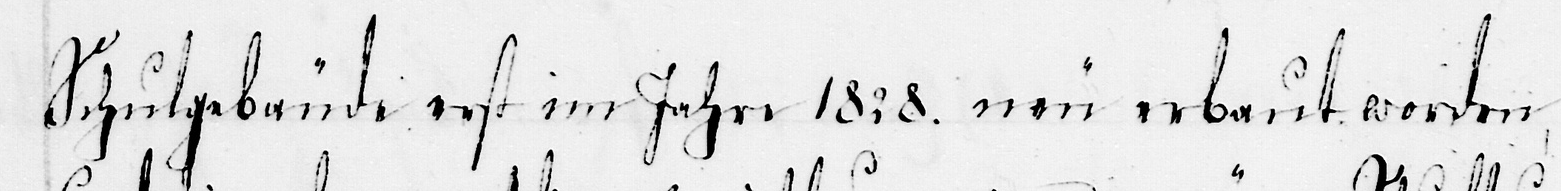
Schulgebäude erst im Jahre 1828. neu erbaut worden
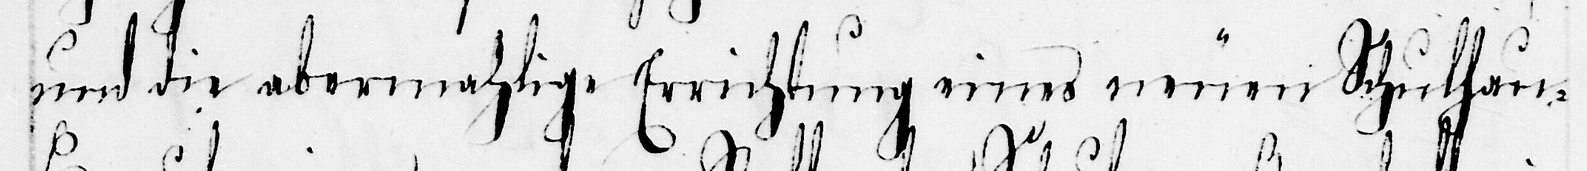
und die abermahlige Errichtung eines neuen Schulhau¬
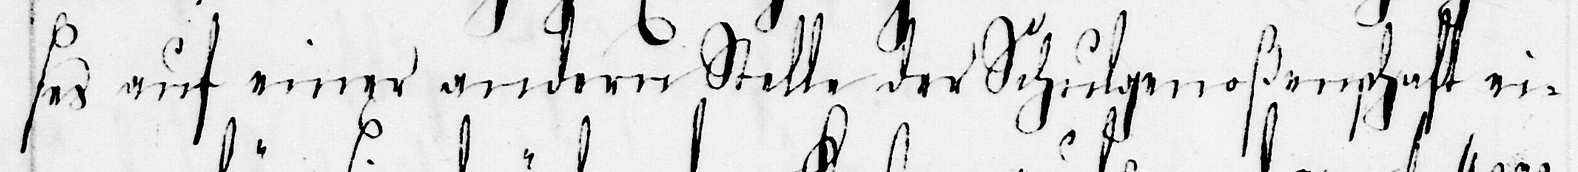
ses auf einer andern Stelle der Schulgenoßenschaft ei¬
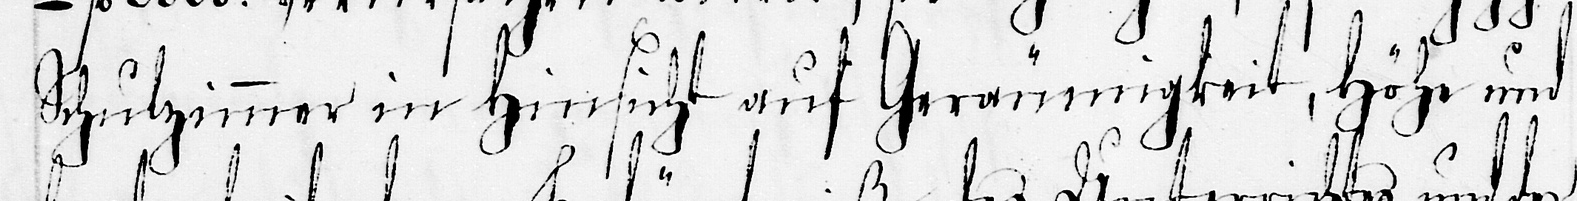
Schulzimmer in Hinsicht auf Geräumigkeit, Höhe und
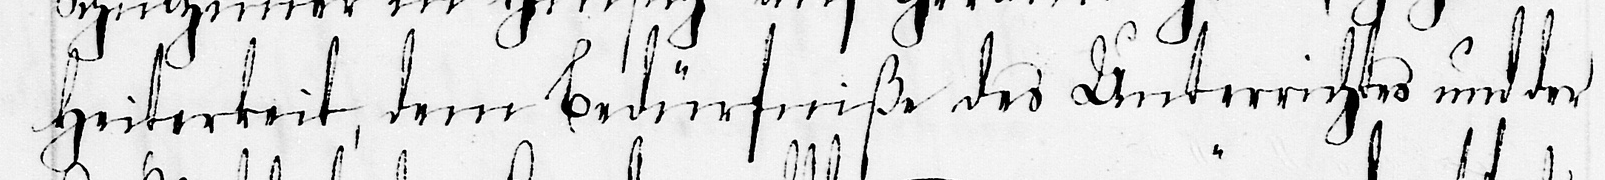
Heiterkeit, dem Bedürfniße des Unterrichtes und der
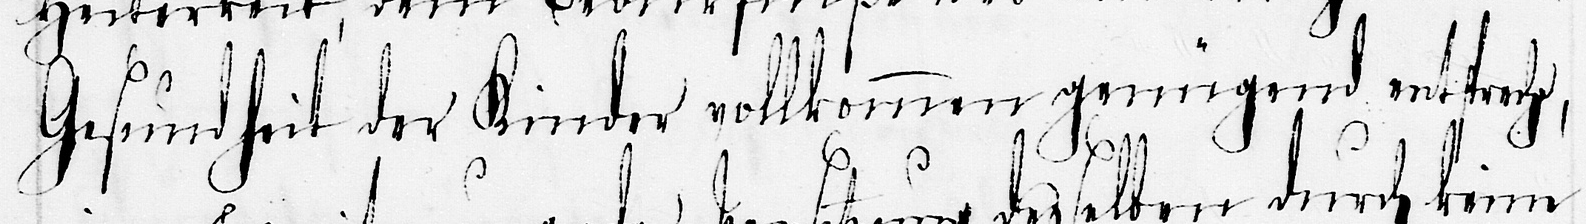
Gesundheit der Kinder vollkommen genügend entsprec¬
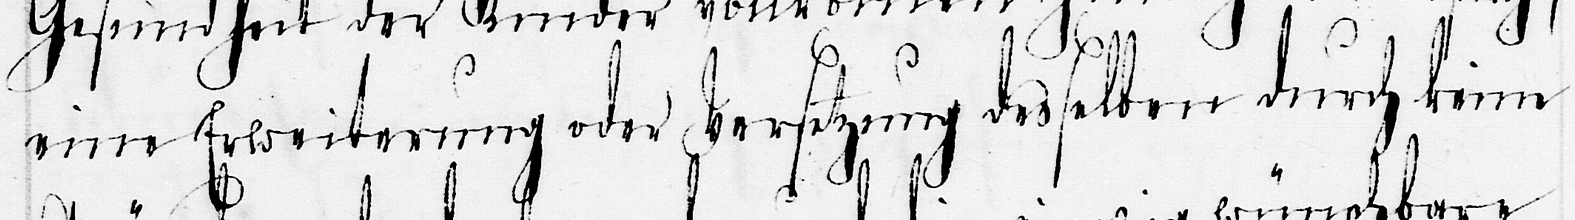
eine Erweiterung oder Versetzung desselben durch keine
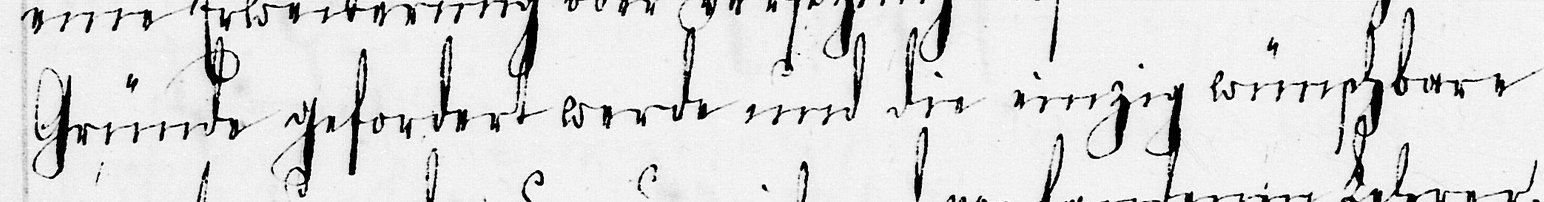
Gründe gefordert werde und die einzig wünschbare
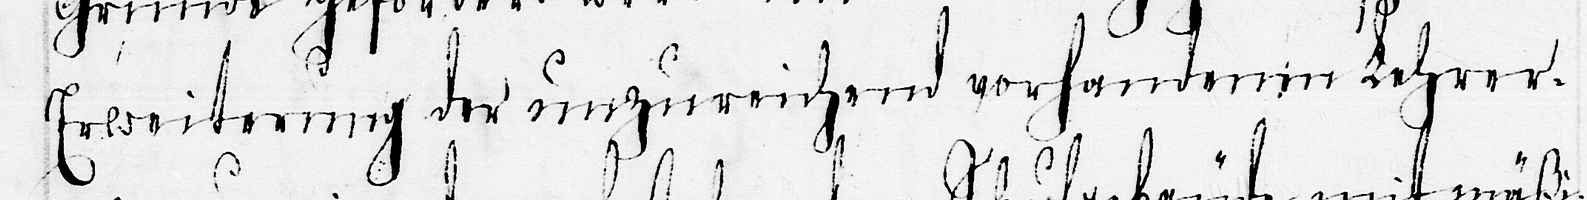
Erweiterung der unzureichend vorhandenen Lehrer¬
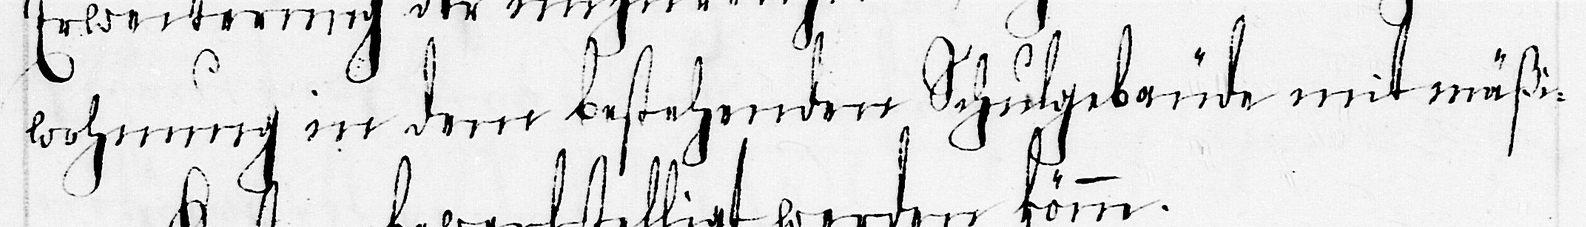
wohnung in dem bestehenden Schulgebäude mit mäßi¬
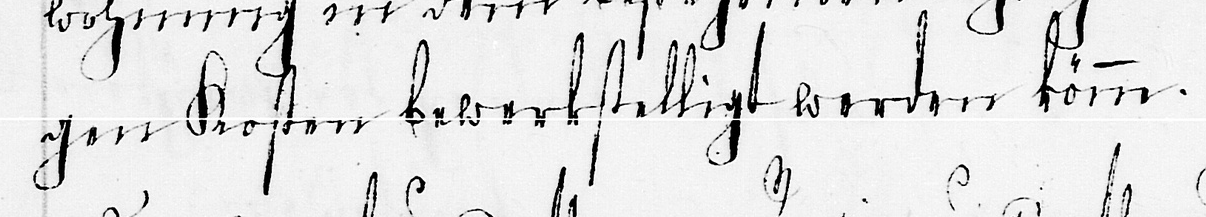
gen Kosten bewerkstelligt werden könne.
